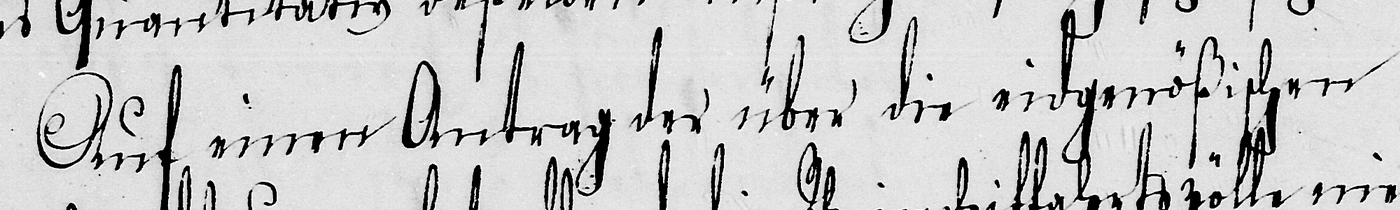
Auf einen Antrag der über die eidgenößischen
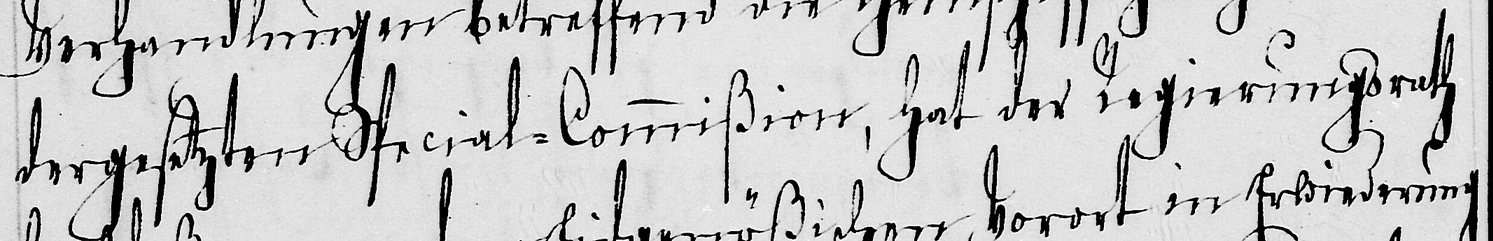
dergesetzten Special-Commißion, hat der Regierungsrath
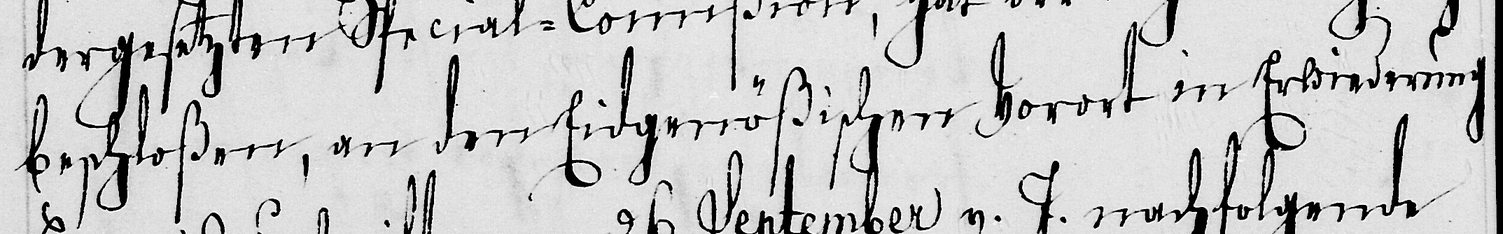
beschloßen, an den Eidgenößischen Vorort in Erwiederung
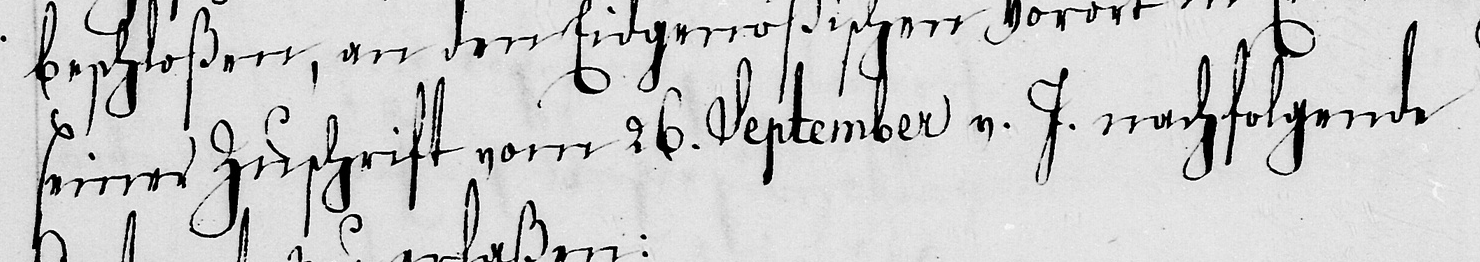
seiner Zuschrift vom 26. September v. J. nachfolgende
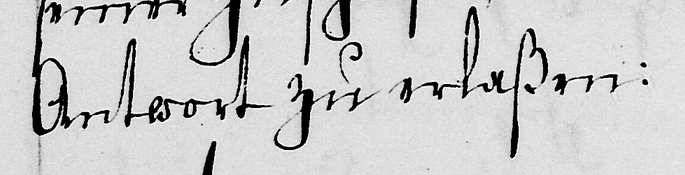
Antwort zu erlaßen:
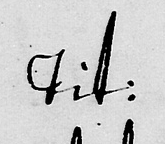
Tit:
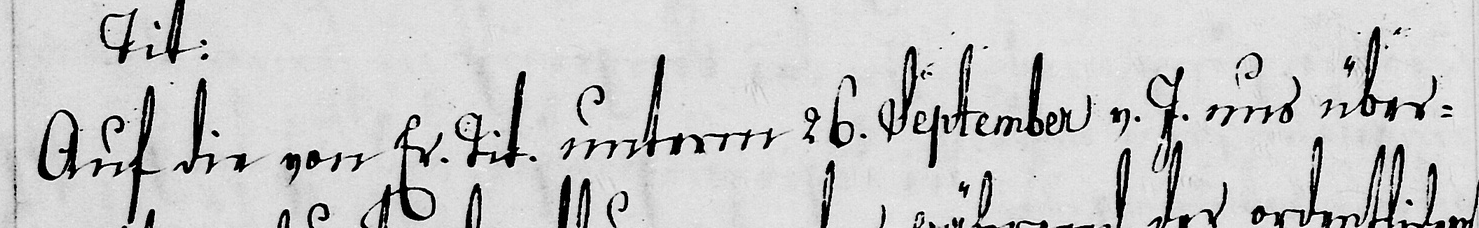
Auf die von Er. Tit. unterm 26. September v. J. uns über¬
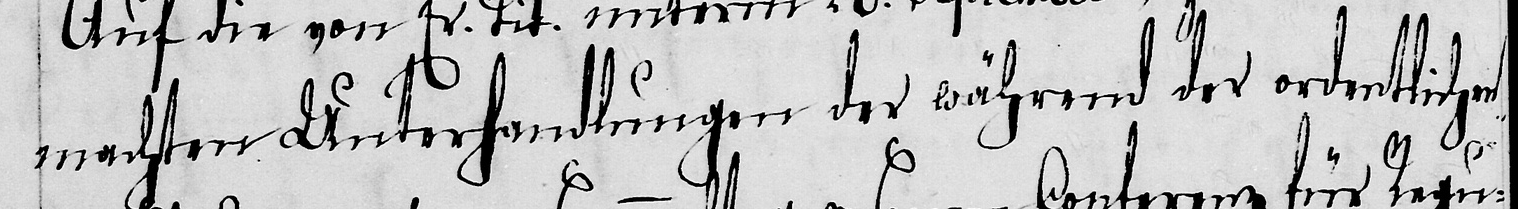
machten Unterhandlungen der während der ordentlich¬
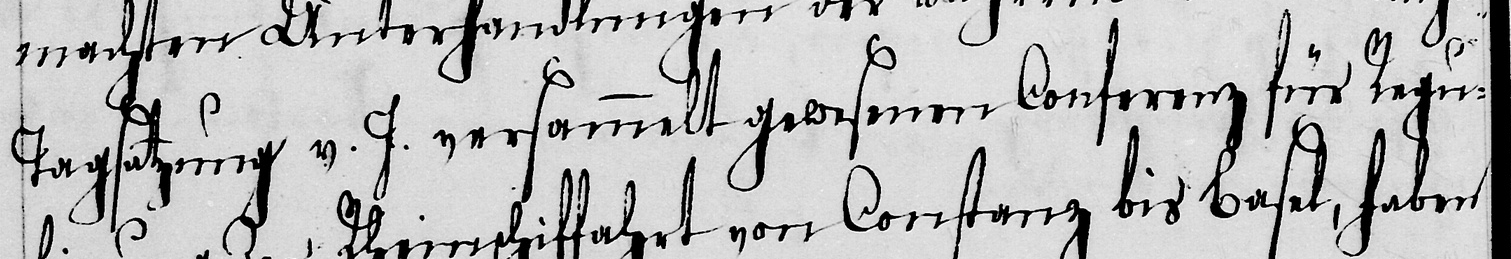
Tagsatzung v. J. versammelt gewesenen Conferenz für Regu¬
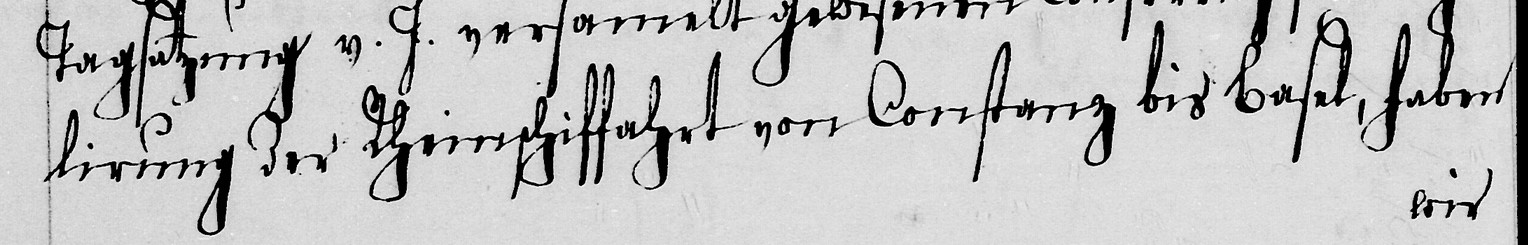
lirung der Rheinschiffahrt von Constanz bis Basel, haben
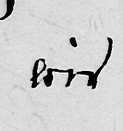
nie¬
